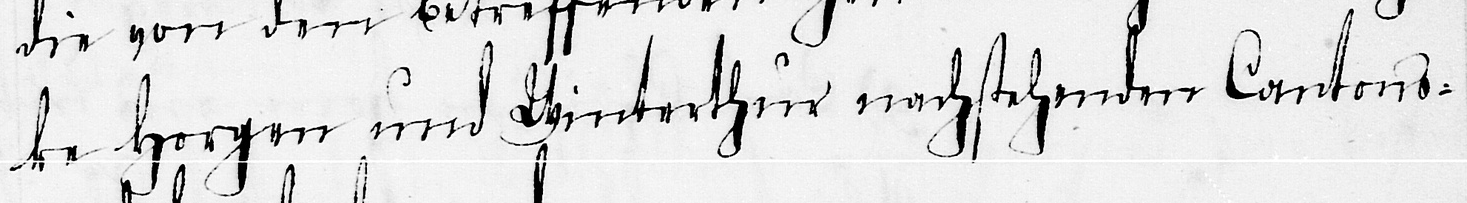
ke Horgen und Winterthur nachstehenden Cantons-
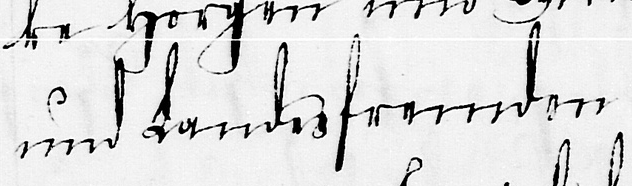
und Landesfremden
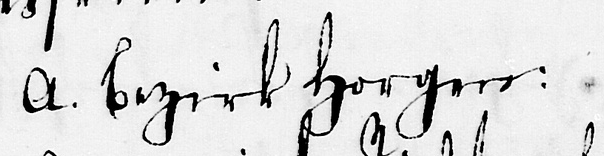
A. Bezirk Horgen:
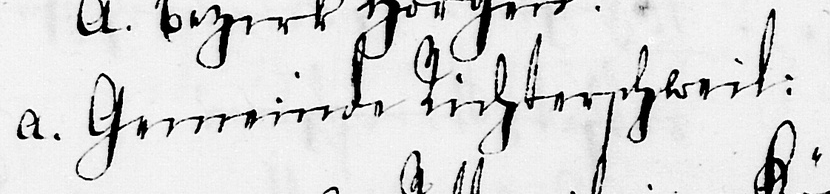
a. Gemeinde Richterschweil:
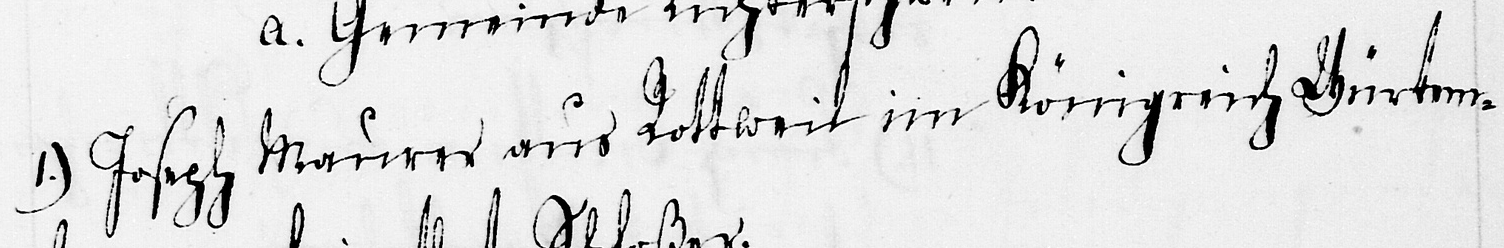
1.) Joseph Maurer aus Rottweil im Königreich Würtem¬
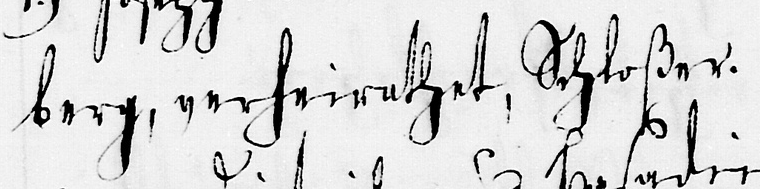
berg, verheirathet, Schloßer.
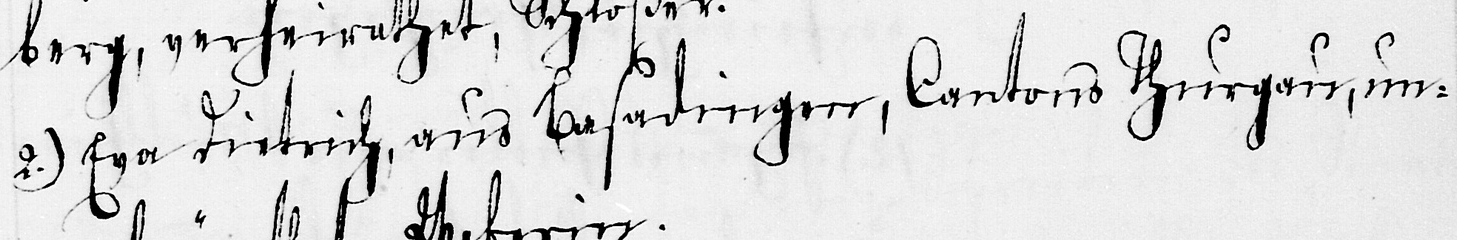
2.) Eva Dietrich, aus Basadingen, Cantons Thurgau, un¬
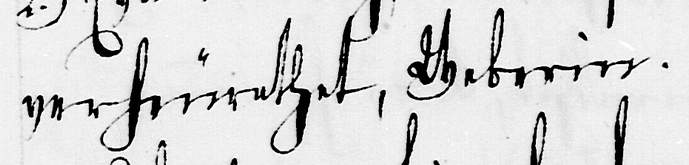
verheurathet, Weberin.
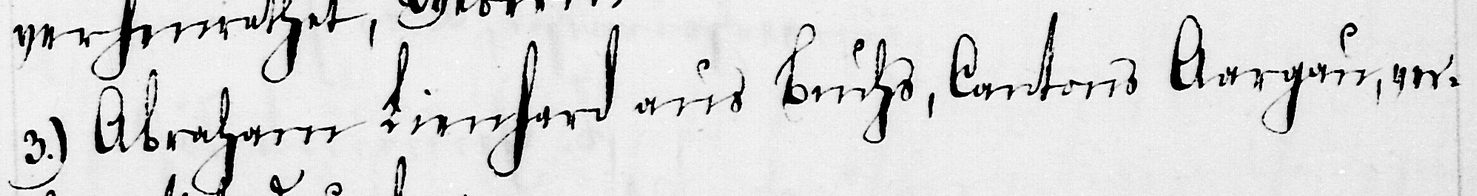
3.) Abraham Lienhard aus Buchs, Cantons Aargau, ver¬
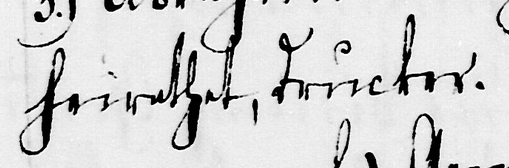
heirathet, Drucker.
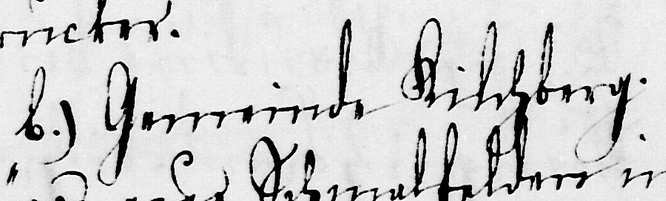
b.) Gemeinde Kilchberg:
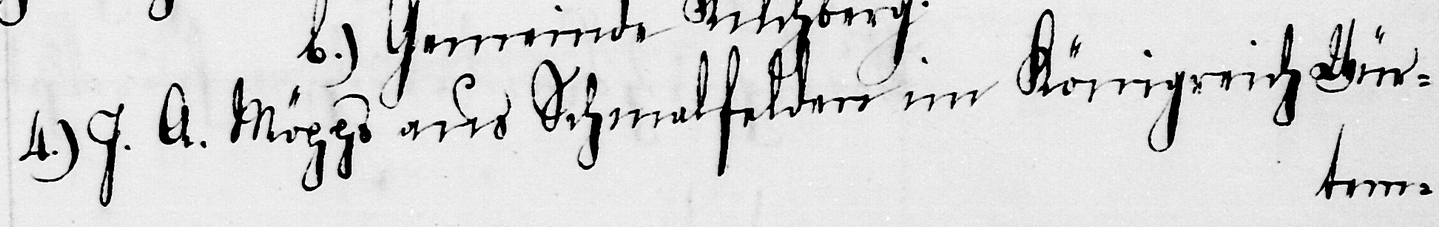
4.) J. A. Möpps aus Schmalfelden im Königreich Wür-
